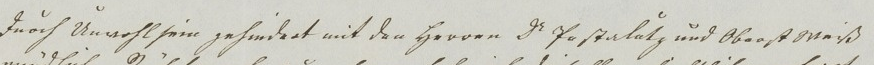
Durch Unwohlsein gehindert mit den Herren Dr Pestalutz und Oberst Weiß
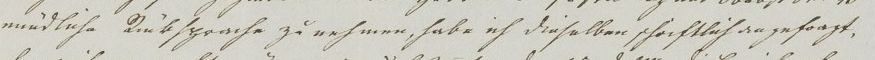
mündliche Rücksprache zu nehmen, habe ich dieselben schriftlich angefragt,
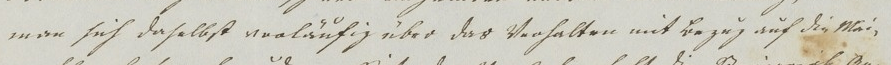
man sich daselbst vorläufig über das Verhalten mit Bezug auf die Mai-
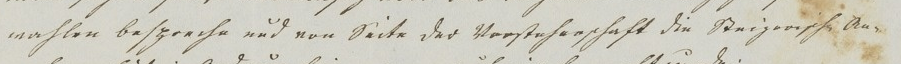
wahlen bespreche und von Seite der Vorsteherschaft die Steigerische An-
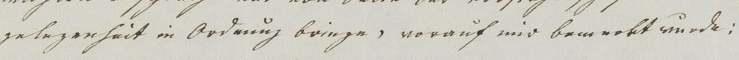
gelegenheit in Ordnung bringe, worauf mir bemerkt wurde:
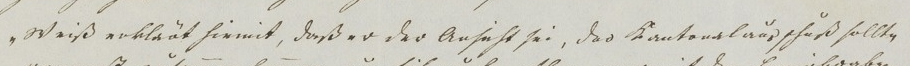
«Weiß erklärt hiemit daß er der Ansicht sei, der Kantonalausschuß sollte
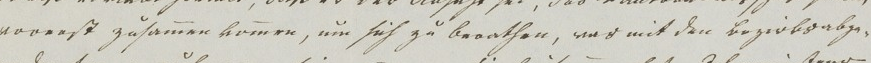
vorerst zusammen kommen, um sich zu berathen, was mit den Bezirksabge-
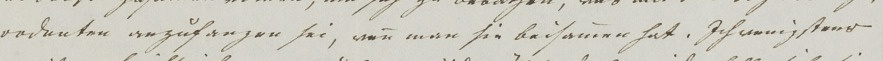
ordneten anzufangen sei, wenn man sie beisammen hat. Ich wenigstens
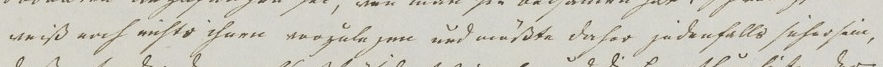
weiß noch nichts ihnen vorzulegen und müßte daher jedenfalls sicher sein,
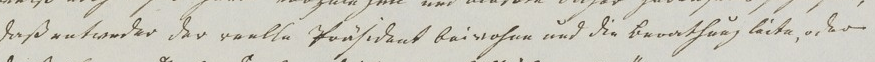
daß entweder der reellePräsident beiwohne und die Berathung leite, oder
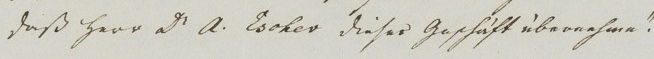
daß Herr Dr A. Escher dieses Geschäft übernehme».
